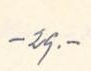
29
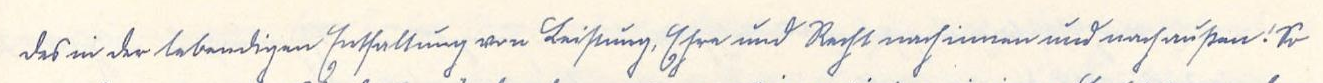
des in der lebendigen Entfaltung von Leistung, Ehre und Recht nach innen und außen! So
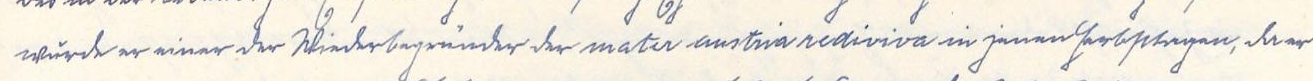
wurde er einer der Wiederbegründer der mater austria rediviva, in jenen Herbsttagen, da er
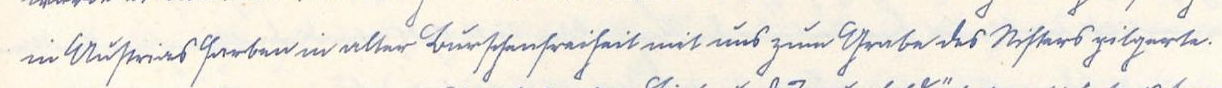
in Austrias Farben in alter Burschenfreiheit mit uns zum Grabe des Stifters pilgerte.
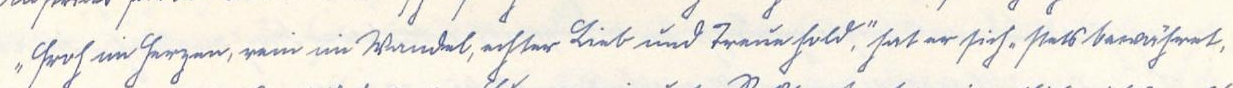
„Froh im Herzen, rein im Wandel, echter Liebe und Treue hold“, hat er sich „stets bewähret,
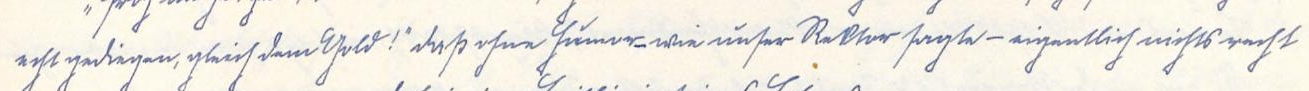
recht gediegen, gleich dem Gold.“ Daß ohne Humor, wie unser Rektor sagte,- eigentlich nichts recht
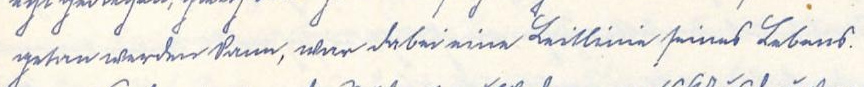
getan werden kann, war dabei eine Leitlinie seines Lebens.
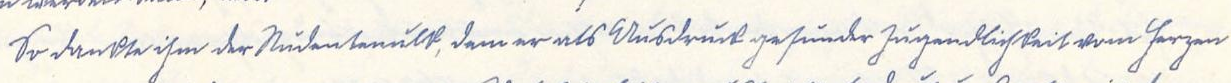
So dankte ihm der Studentenulk, dem er als Ausdruck gesunder Jugendlichkeit vom Herzen
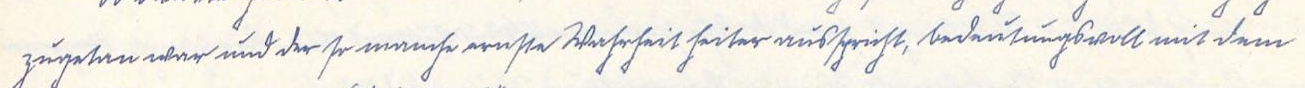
zugetan war und der so manche ernste Wahrheit heiter ausspricht, bedeutungsvoll mit dem
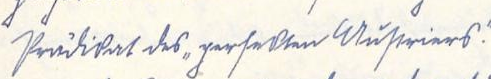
Prädikat des „perfekten Austriers.“
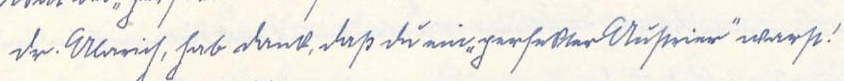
Dr. Alarich, hab dank, daß du ein „perfekter Austrier“ warst!
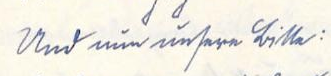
Und nun unsere Bitte:
